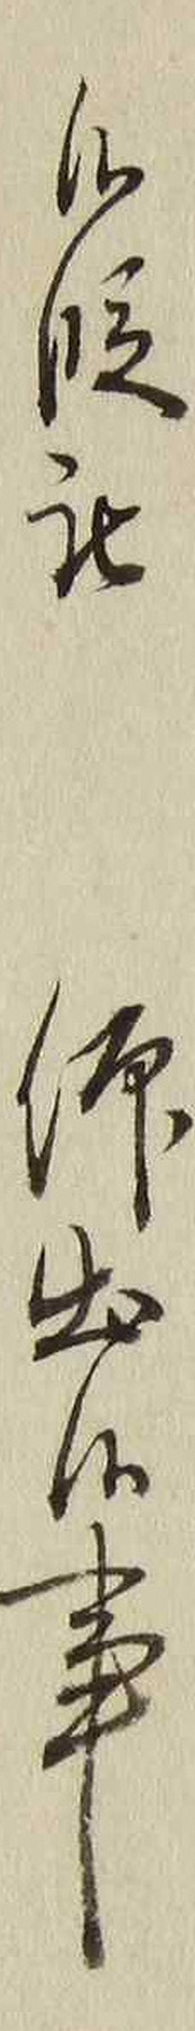候段被仰出候事
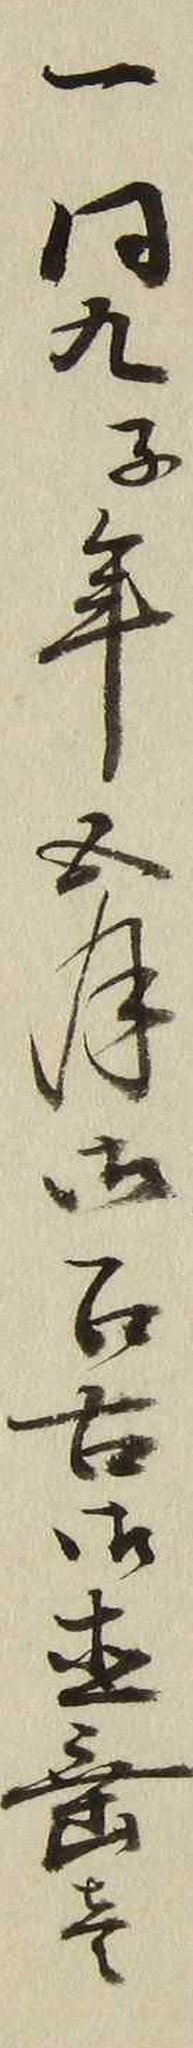一同九年子五月御召古御直垂壱
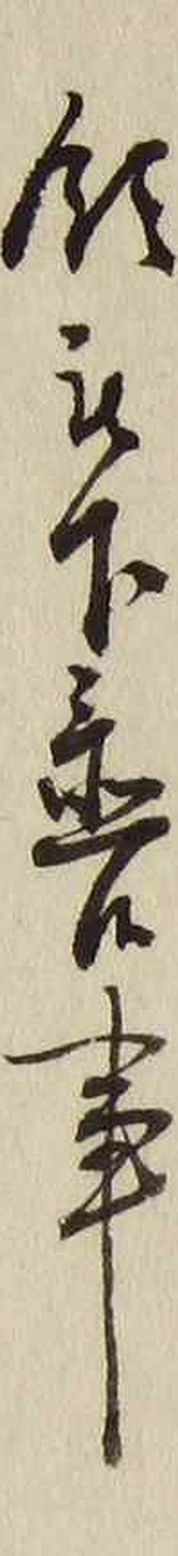領被下置候事
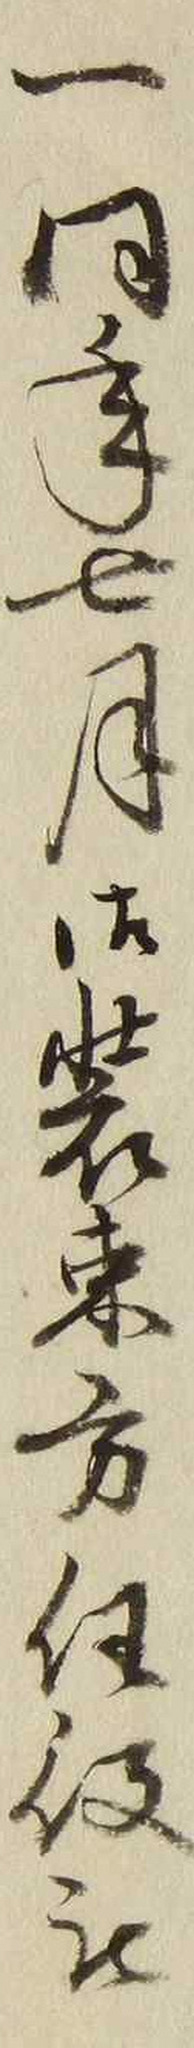一同年七月御装束方任役被

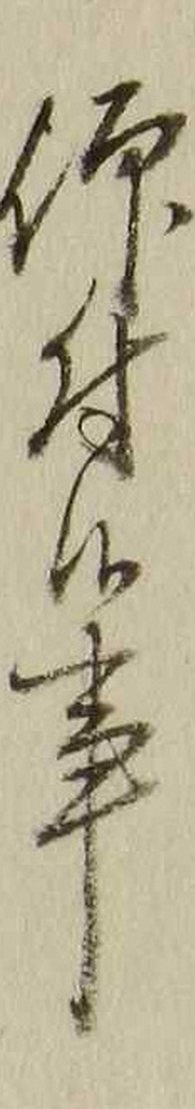仰付候事
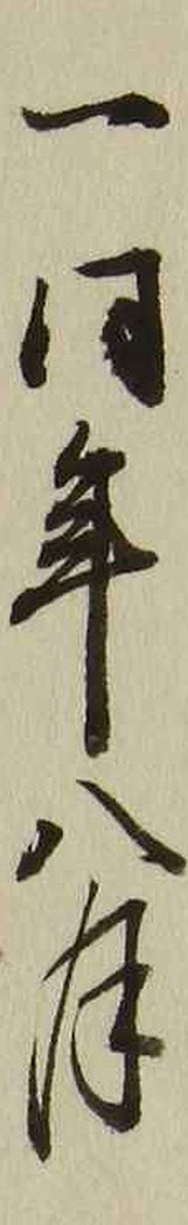一同年八月
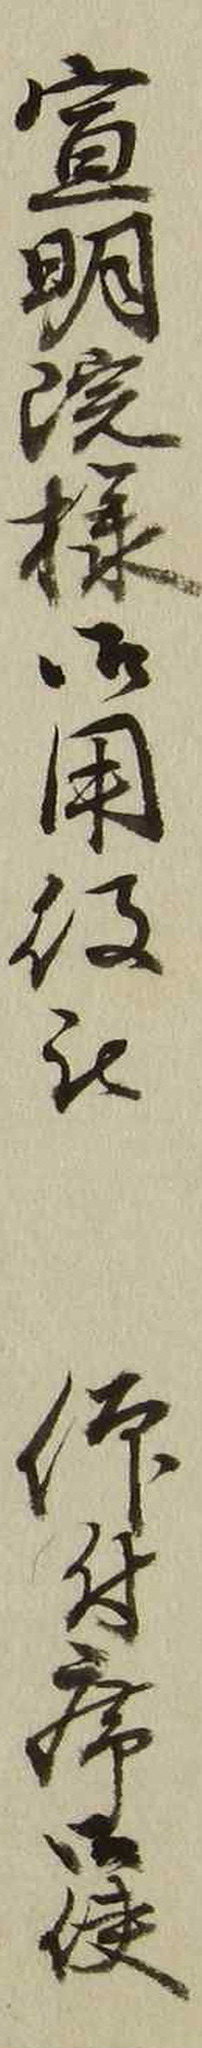宣明院様御用役被仰付席御使
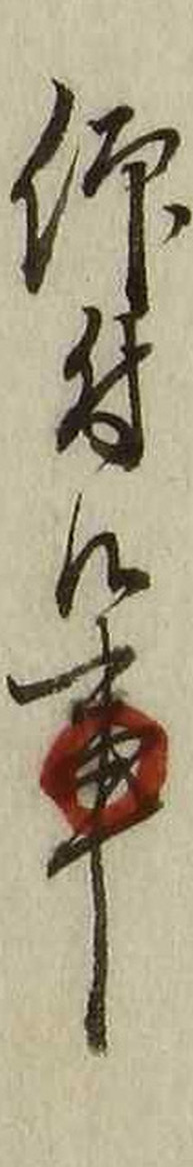仰付候事
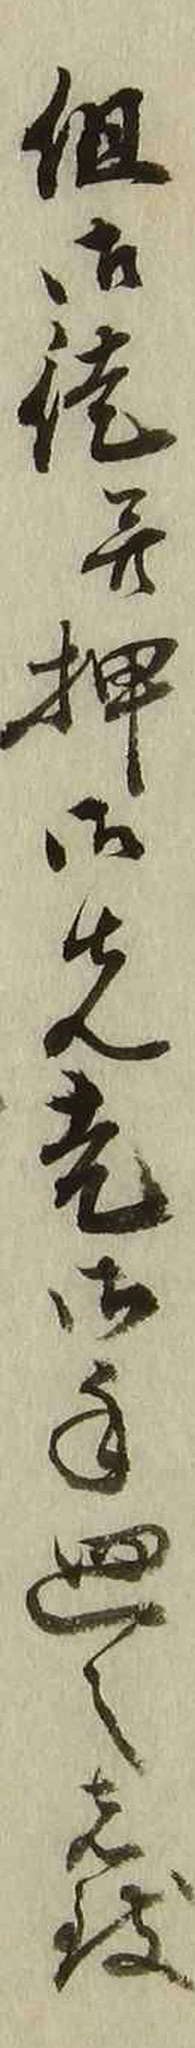但御徒并押御先走御手廻之者致
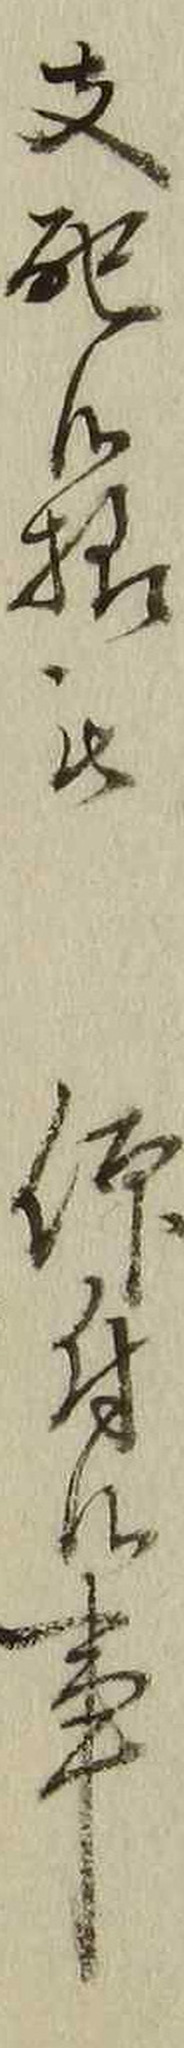支配候様被仰付候事
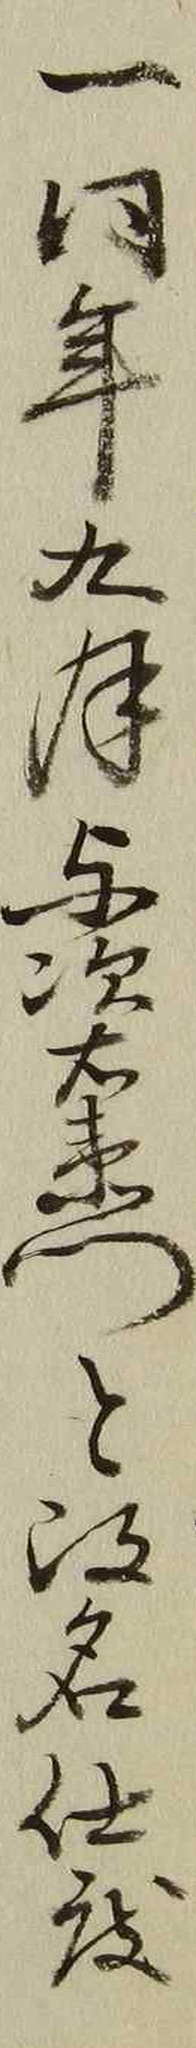一同年九月与次右衛門と改名仕度
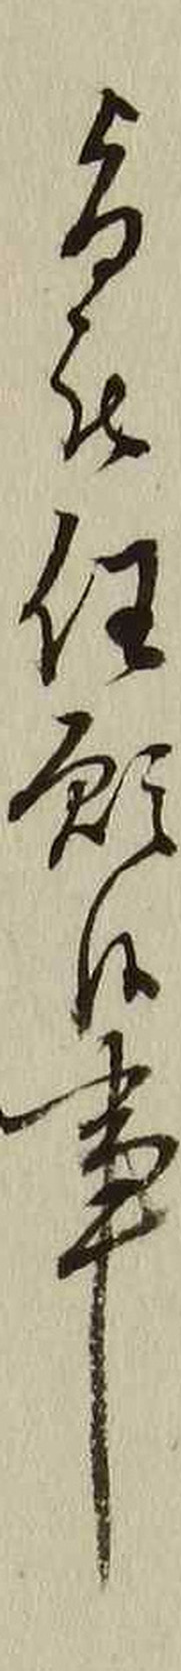旨被任願候事
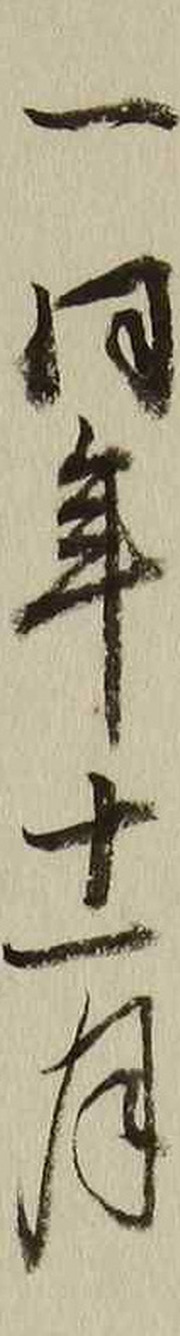一同年十一月
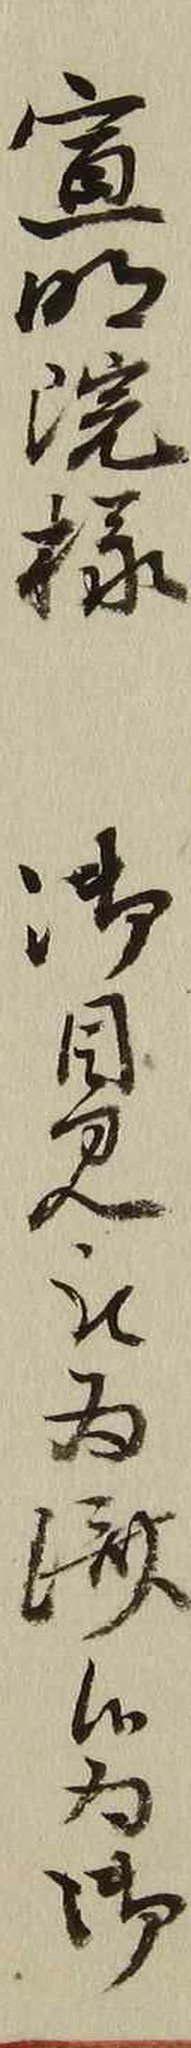宣明院様御目見被為済候為御
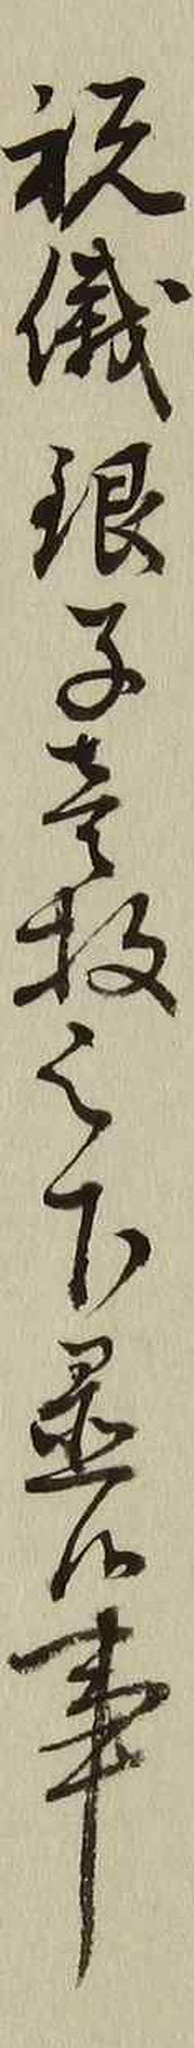祝儀銀子壱枚被下置候事
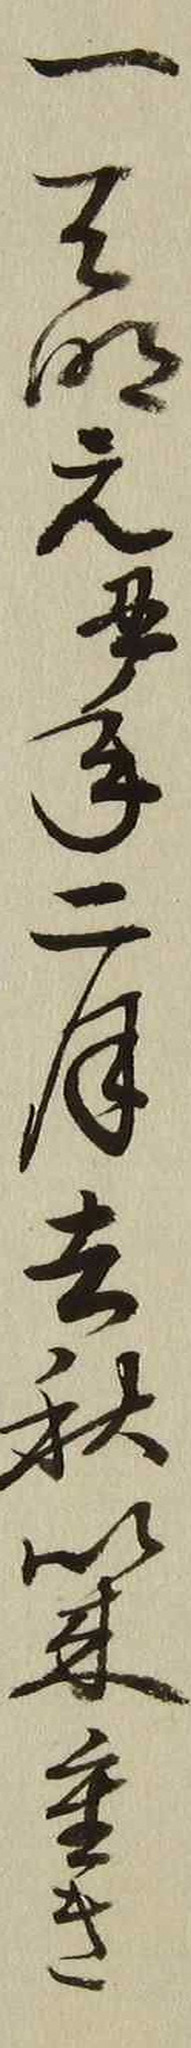一天明元丑年二月去秋以来重き
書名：諸士系譜　巻之35　は之部3
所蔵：会津若松市立会津図書館
